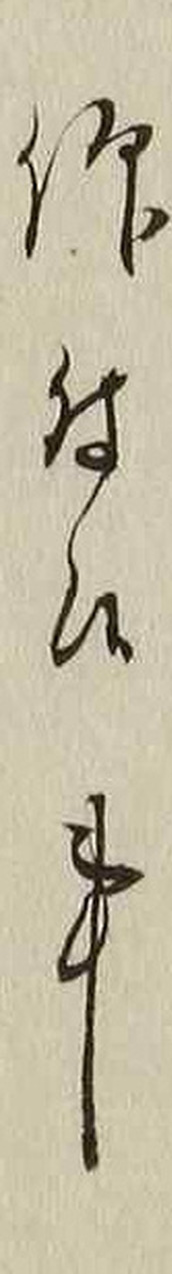仰付候事
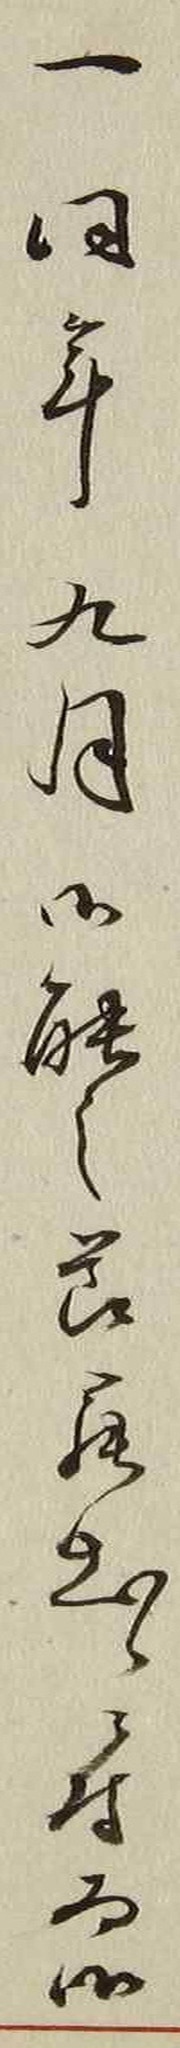一同年九月御能之節罷出候ニ付為御
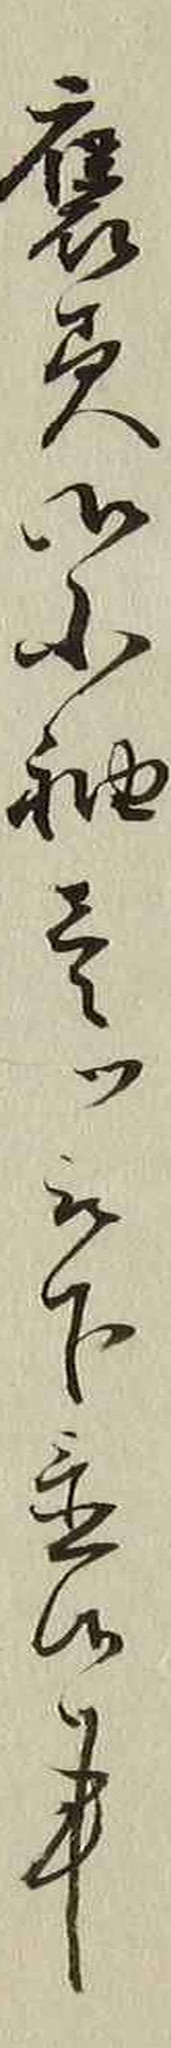褒美御小袖壱ツ被下置候事
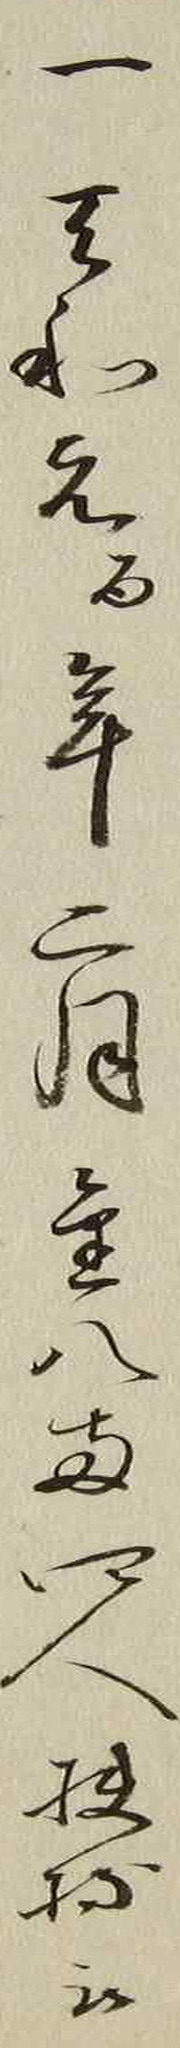一天和元酉年二月金八両四人扶持被
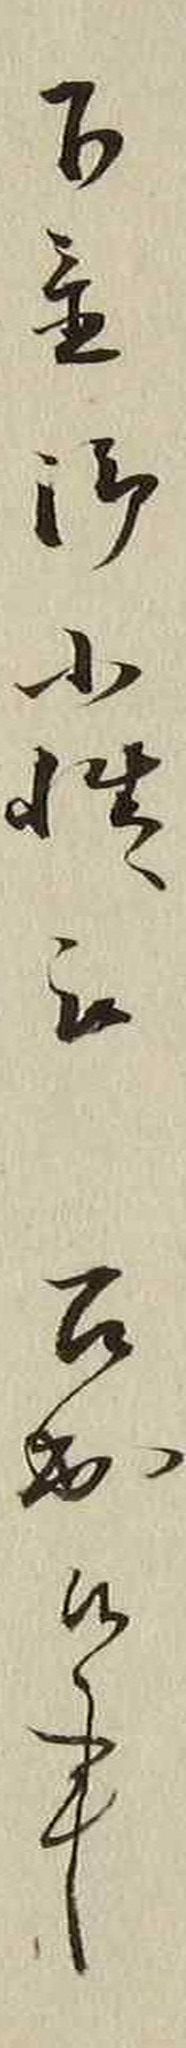下置御小性へ被召出候事
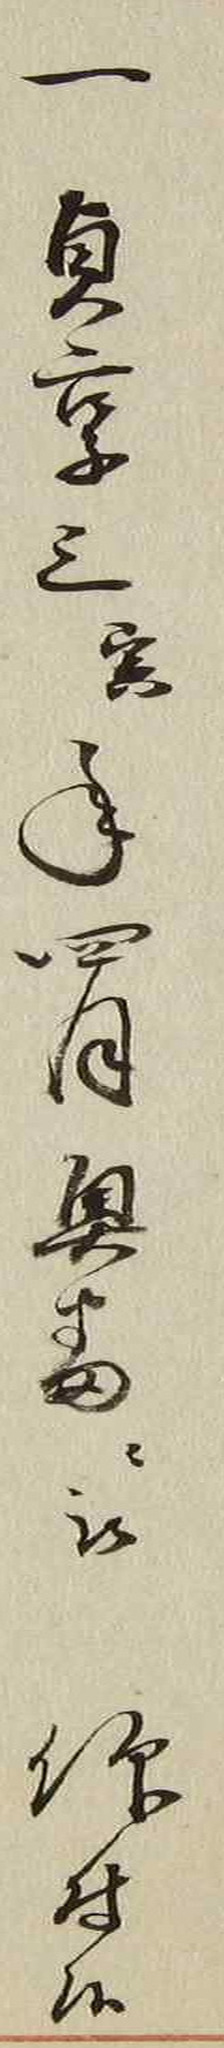一貞享三寅年四月奥番ニ被仰付候
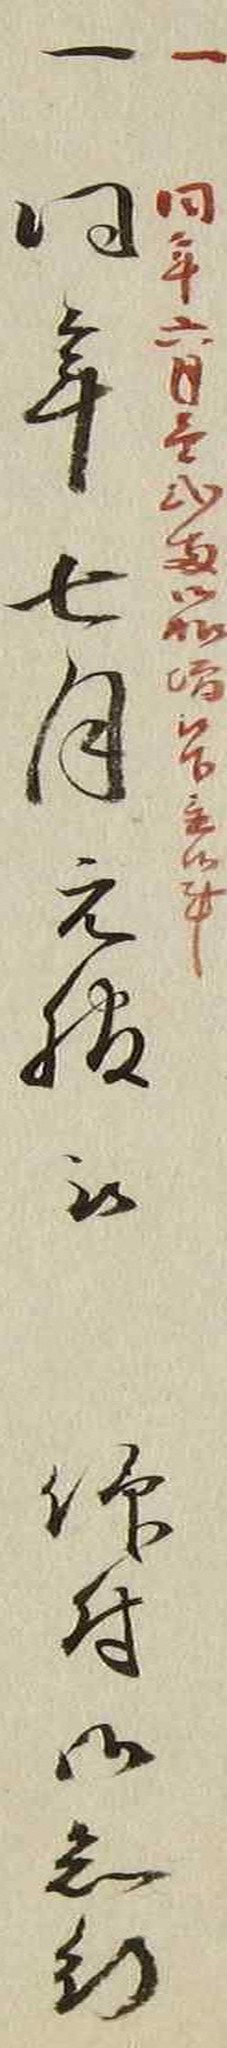一同年七月元服被仰付御知行
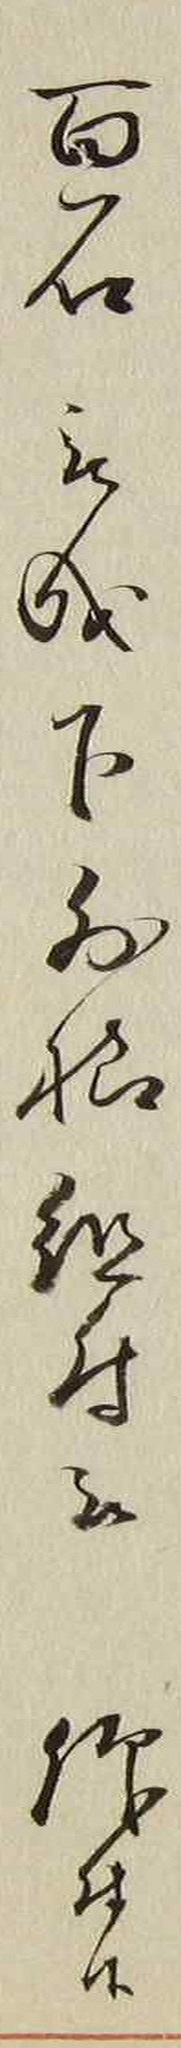百石被成下外様組付被仰付候
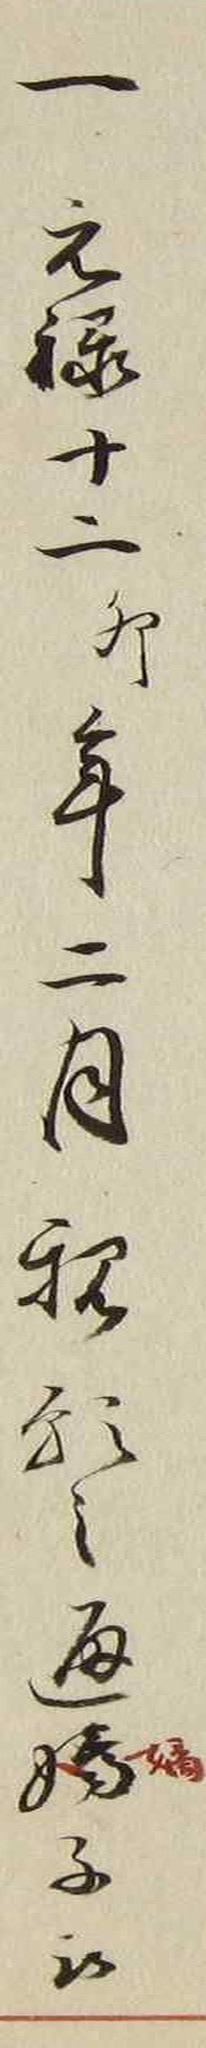一元禄十二卯年二月親願之通嫡子被
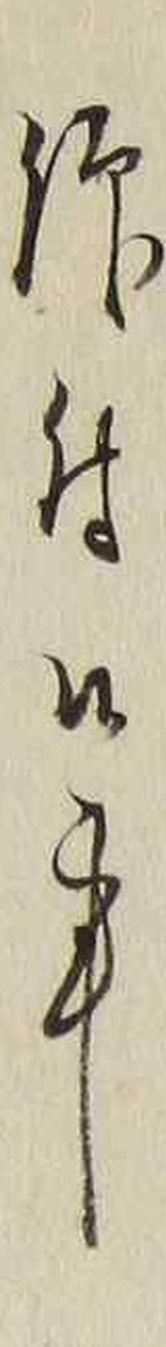仰付候事

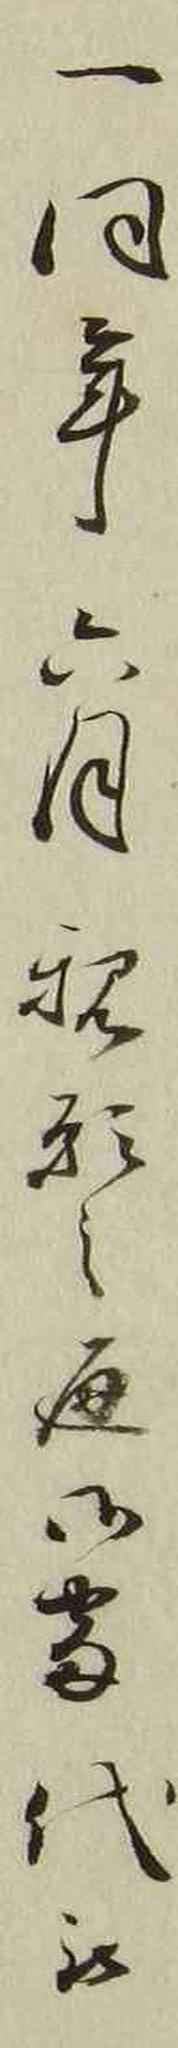一同年六月親願之通御番代被
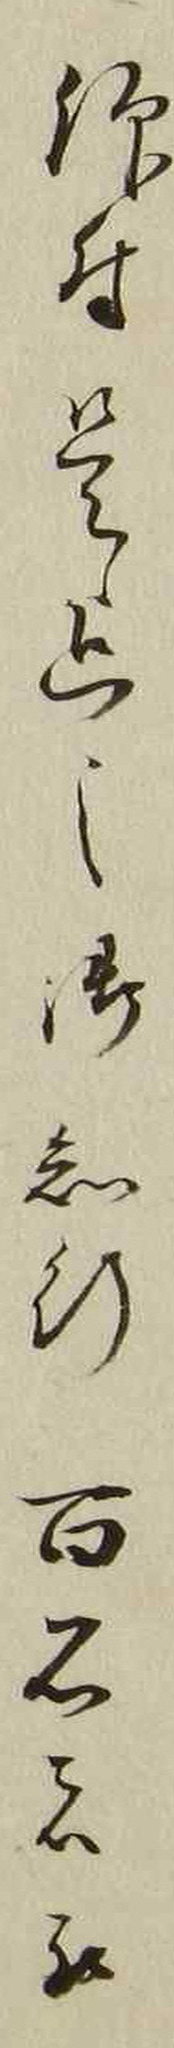仰付是迄之御知行百石者被
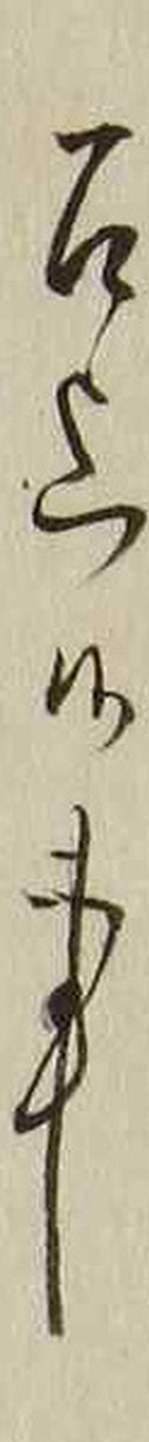召上候事
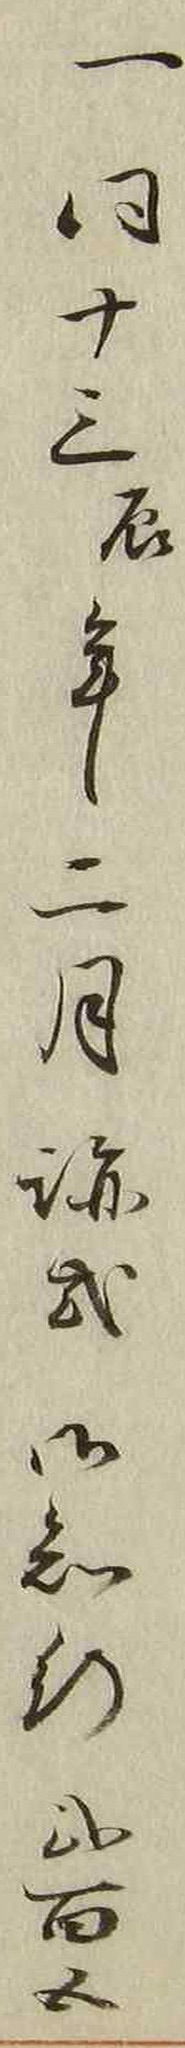一同十三辰年二月跡式御知行弐百五
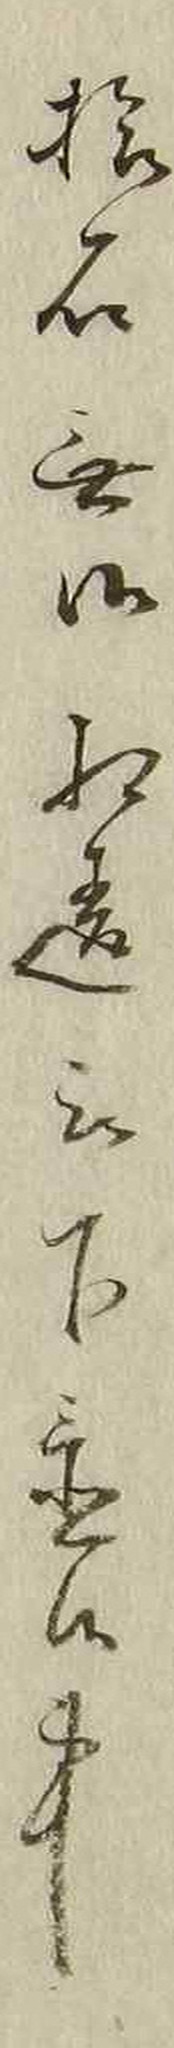拾石無御相違被下置候事
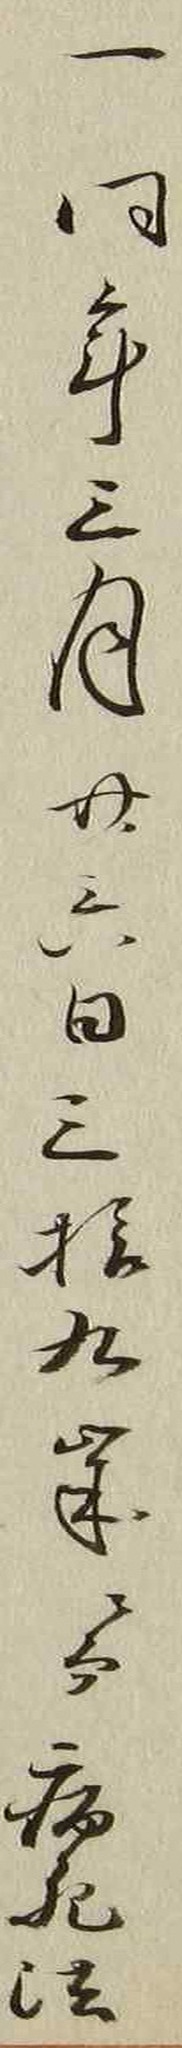一同年三月廿六日三拾九歳ニ而病死法
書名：諸士系譜　巻之28　い之部28
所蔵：会津若松市立会津図書館
